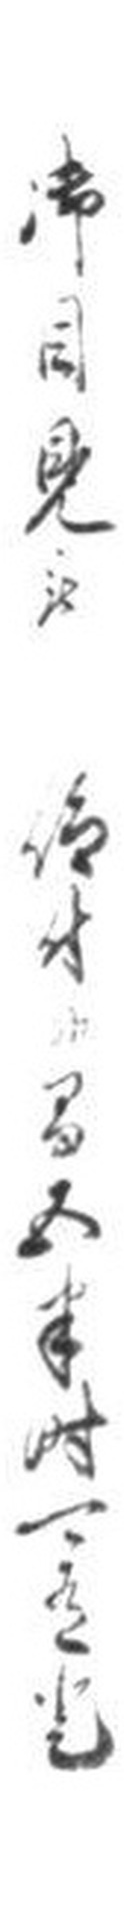御目見被仰付候間五半時可有登
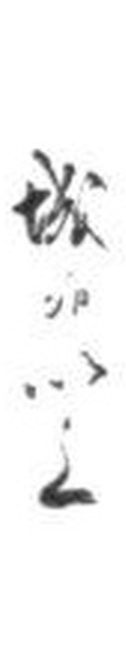城候以上
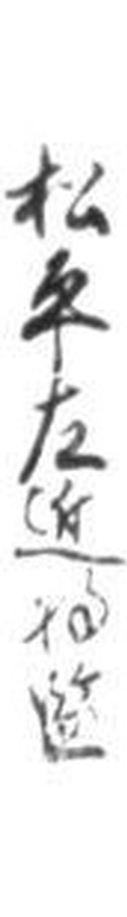松平左近将監
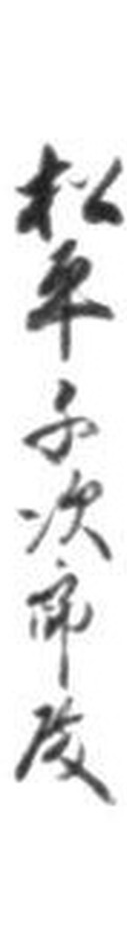松平千次郎殿
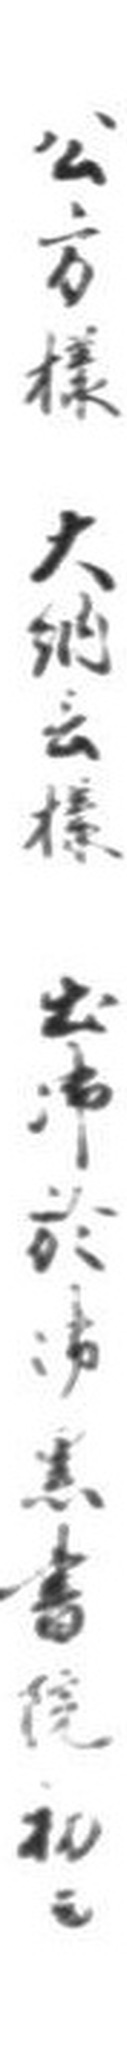公方様大納言様出御於御黒書院初而
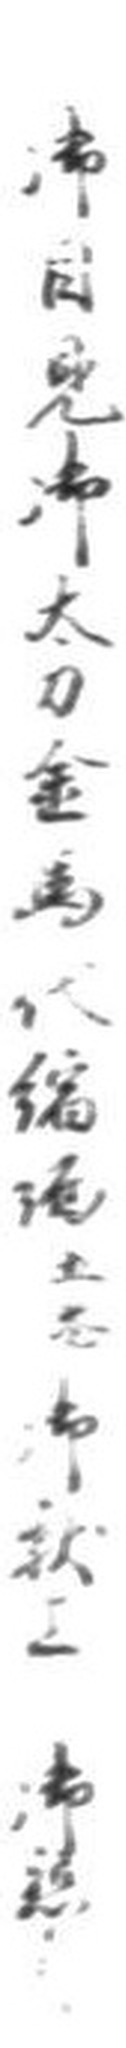御目見御太刀金馬代縮緬十一巻御献上御懇之
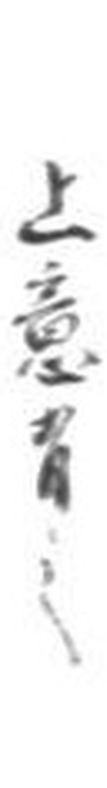上意有之
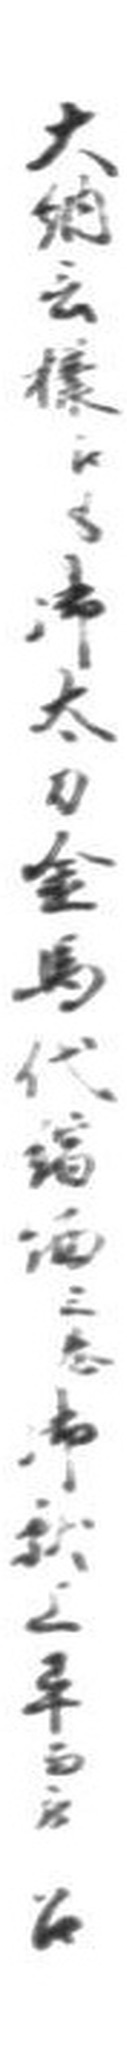大納言様江も御太刀金馬代縮緬三巻御献上畢而被召
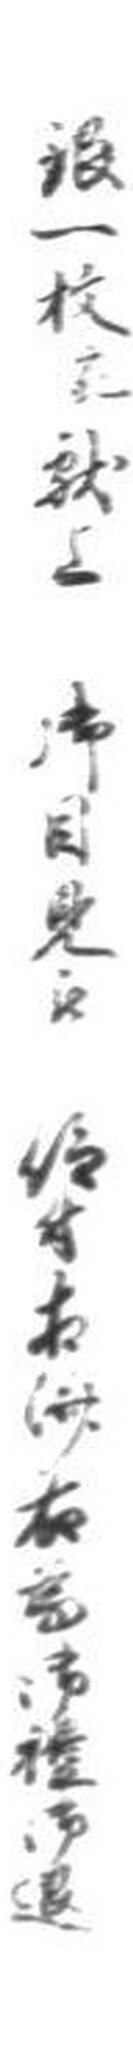銀一枚宛献上御目見被仰付相済右為御礼御退

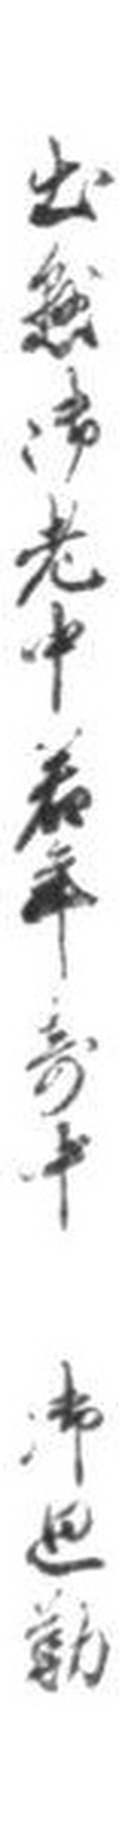出懸御老中若年寄中御廻勤
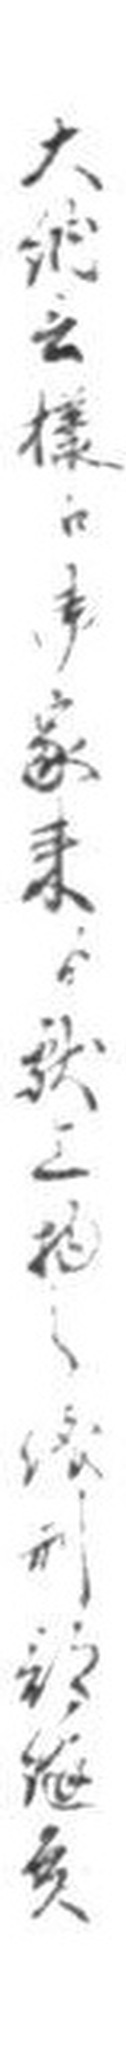大納言様江御家来ゟ献上物之儀刑部縫殿
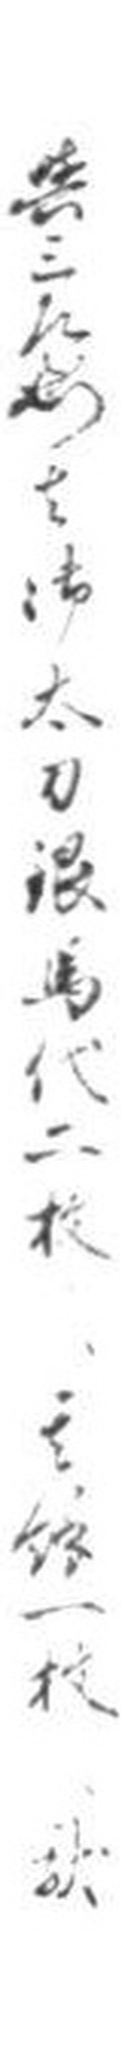与三左衛門は御太刀銀馬代二枚其余一枚献
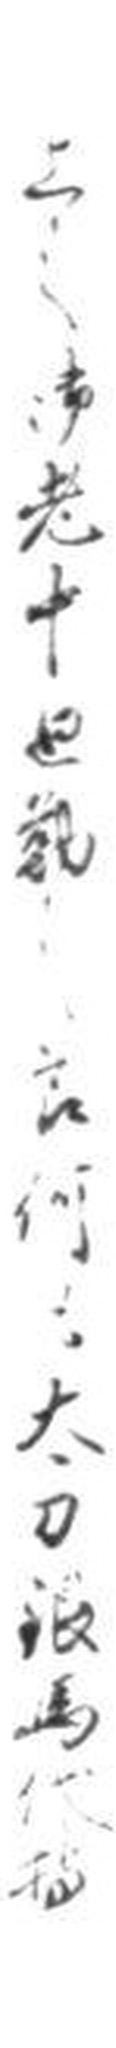上之御老中廻勤之節何も太刀銀馬代持
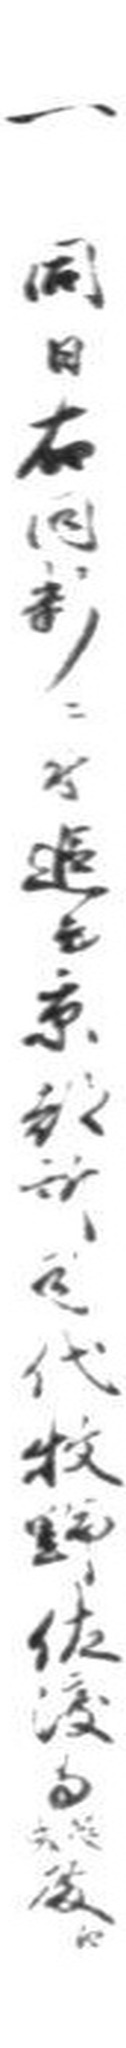一同日右同断ニ付追而京都所司代牧野佐渡守英成殿江
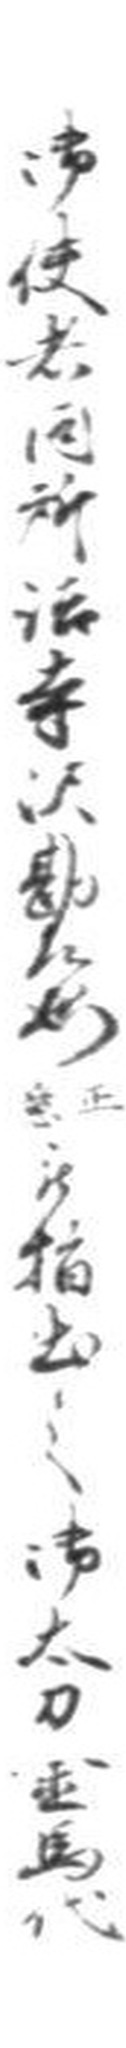御使者同所詰寺沢勘左衛門正被指出之御太刀金馬代
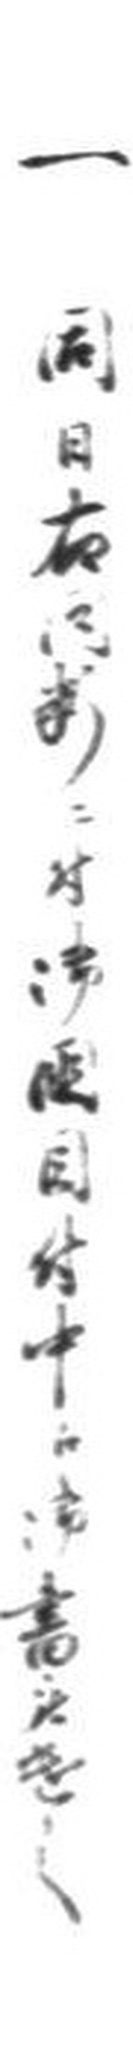一同日右同断ニ付御徒目付中江御書被遣之
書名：家譜 三十九 宗矩公 享保十年
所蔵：福井県文書館 Fukui Prefectural Archives
